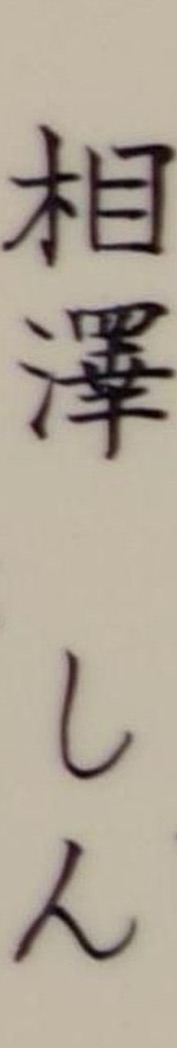相澤しん
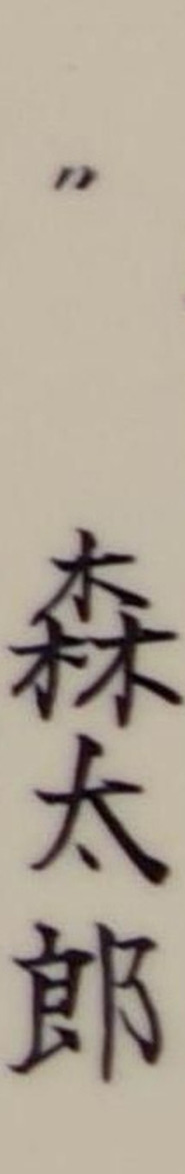森太郎
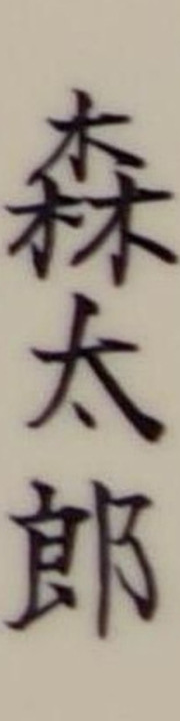森太郎
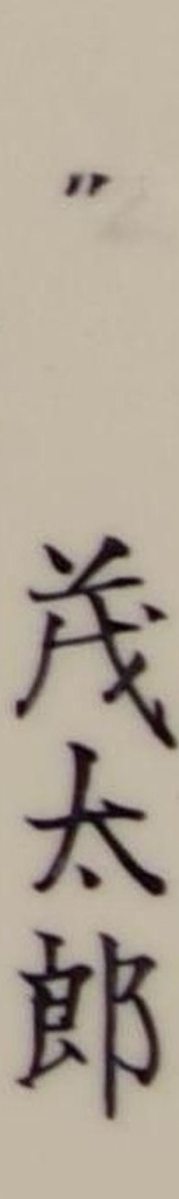茂太郎
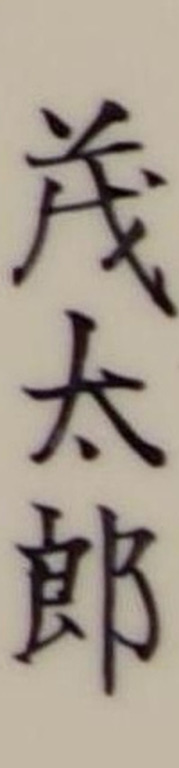茂太郎
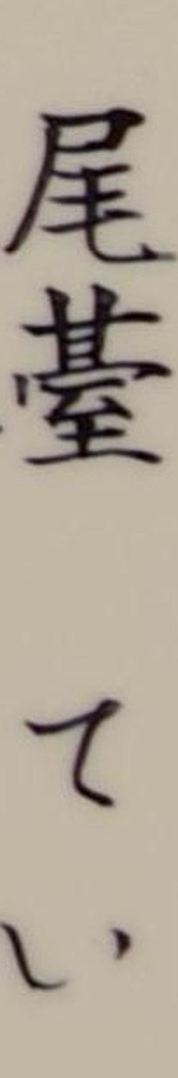尾䑓てい
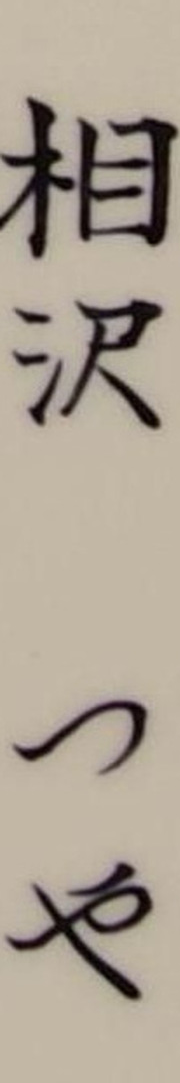相沢つや
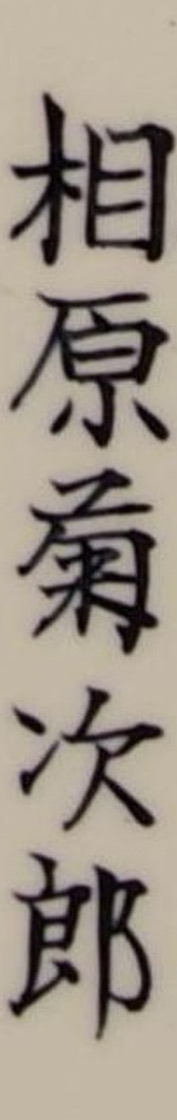柏原菊次郎
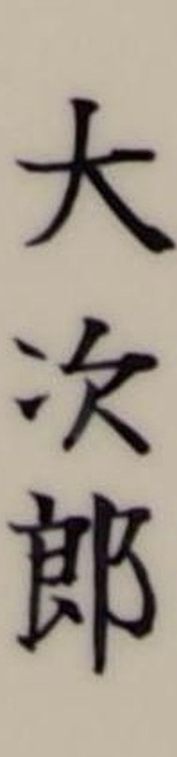大次郎
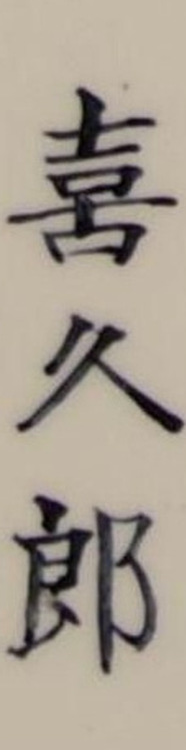喜久郎

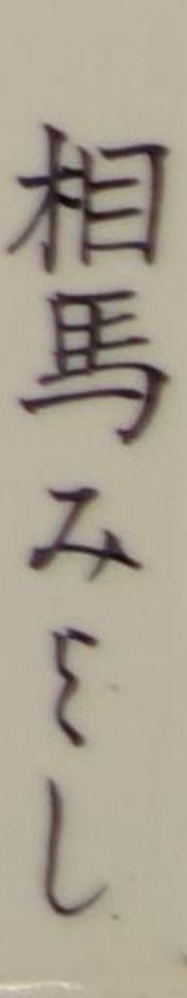相馬みよし
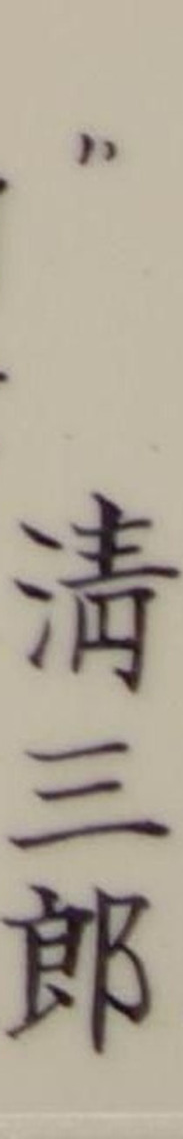清三郎
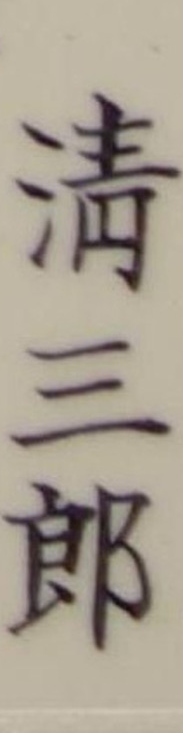清三郎
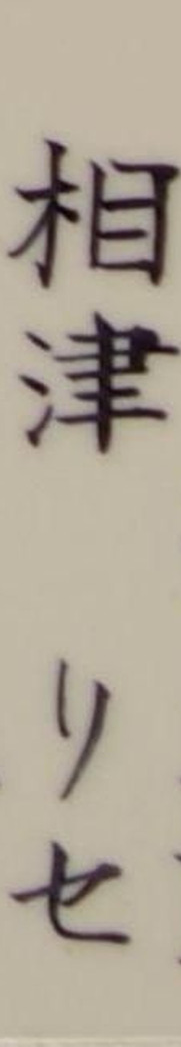相津リセ
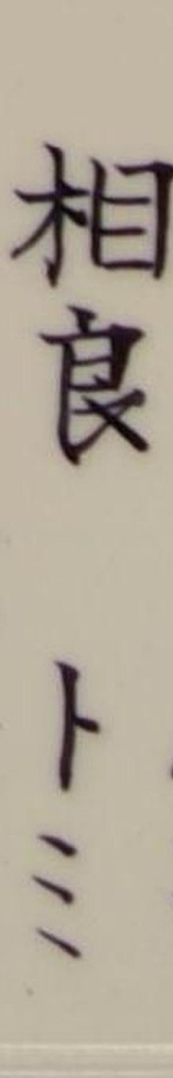相良トミ
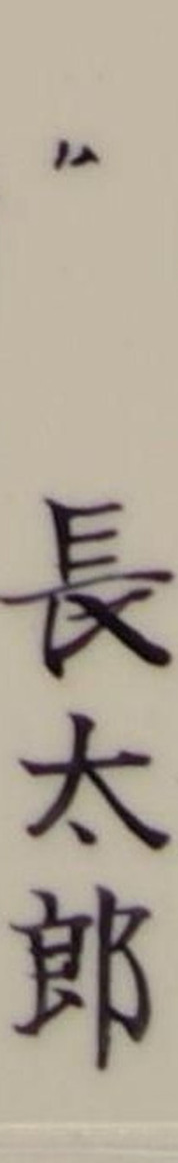長太郎
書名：E~L
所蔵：高野山金剛峯寺
